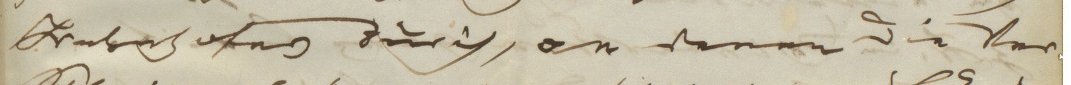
Bahnhofes Zürich, an denen die Ver.
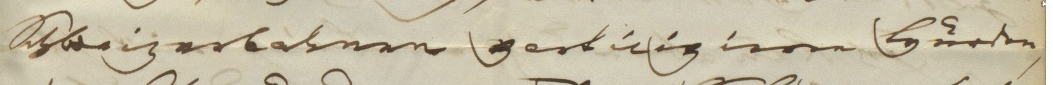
Schweizerbahnen participiren würden,
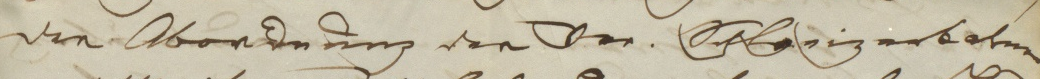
der Abordnung der Ver. Schweizerbahnen
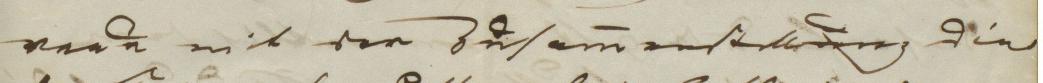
reau mit der Zusammenstellung die-
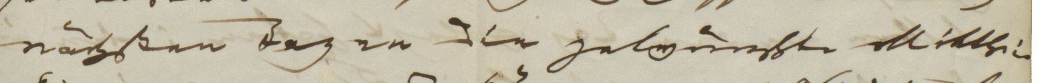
nächsten Tagen die gewünschte Mitthei-
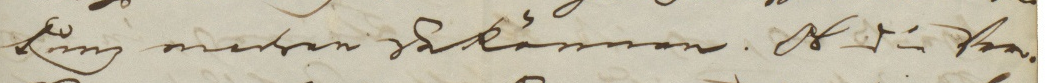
lung machen zukönnen. Ob die Ver.
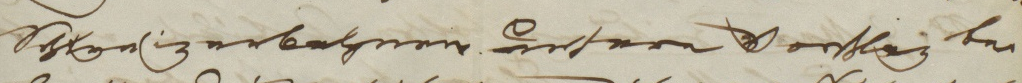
Schweizerbahnen unsern Vorschlag be-
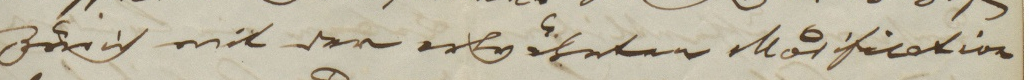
Zürich mit der erwähnten Modification
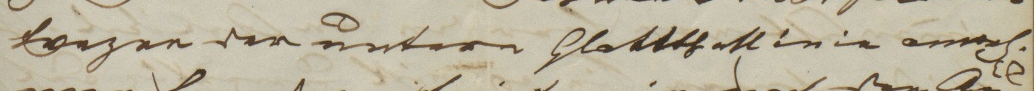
wegen der untern Glattthallinie anneh-
